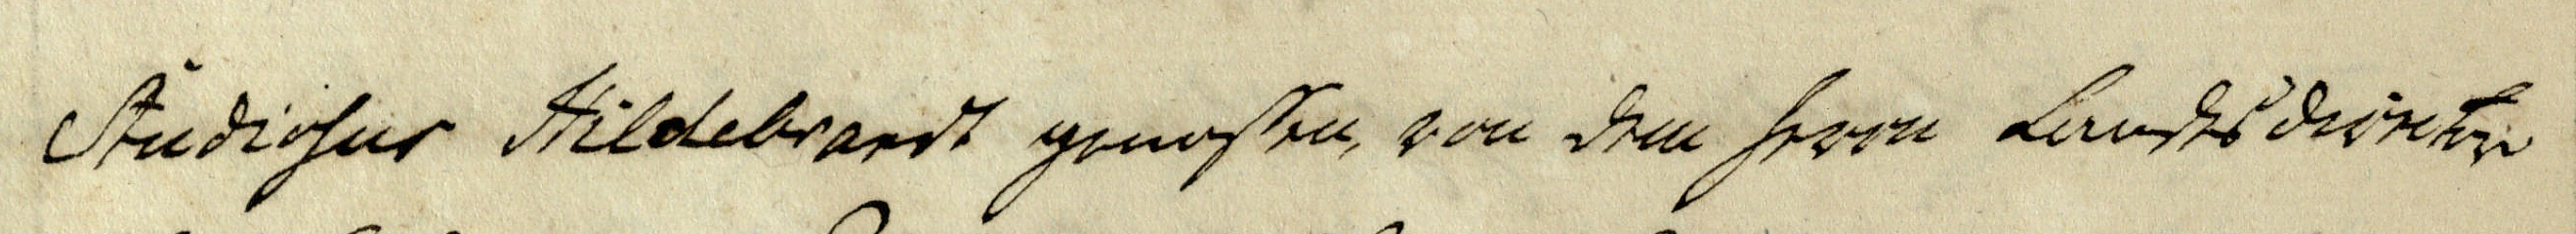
Studiosus Hildebrandt genossen, von dem Herrn Landesdirector
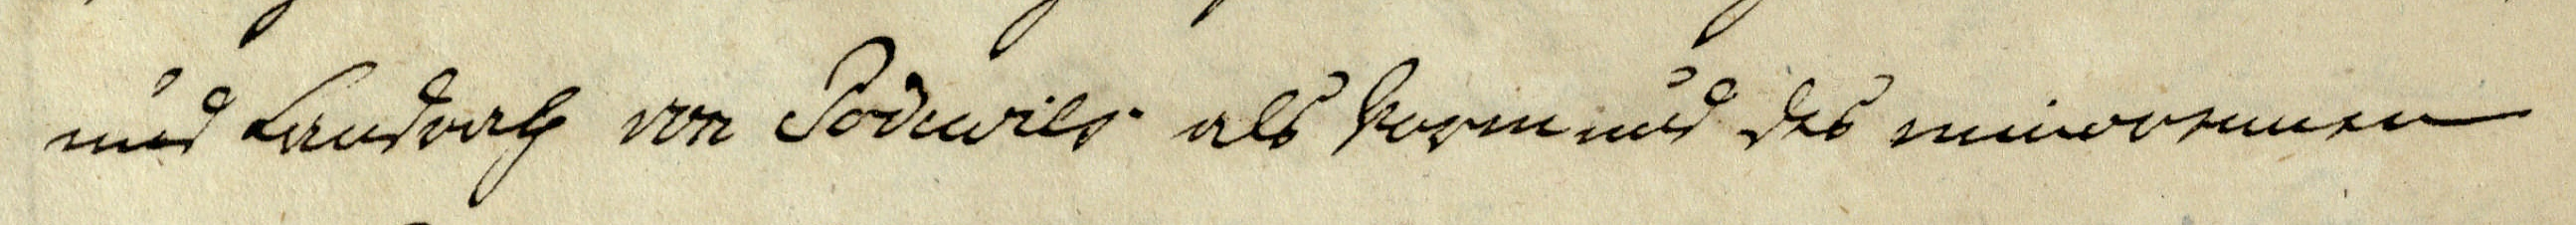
und Landrath von Podewils als Vormund des minorennen
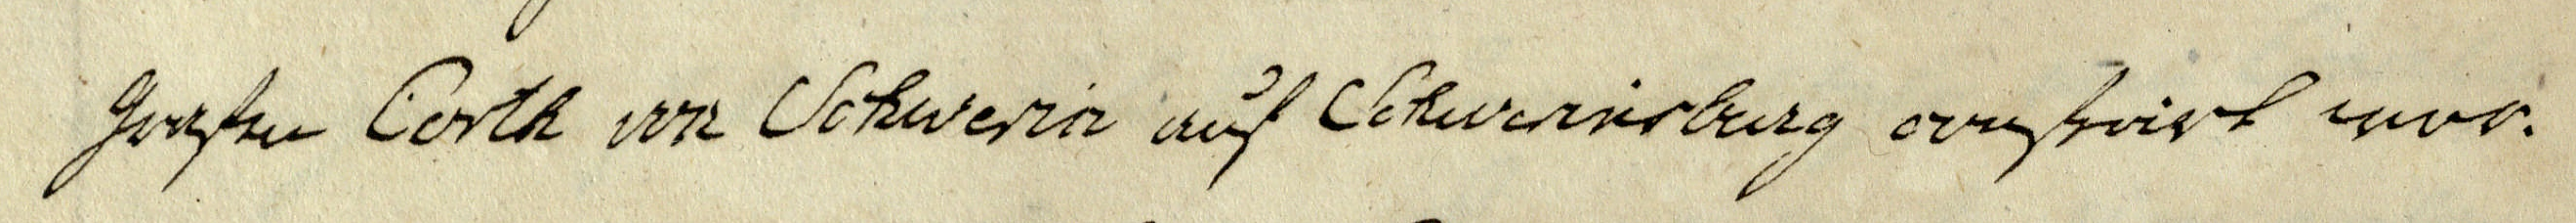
Grafen Corth von Schwerin auf Schwerinsburg conferirt wor¬
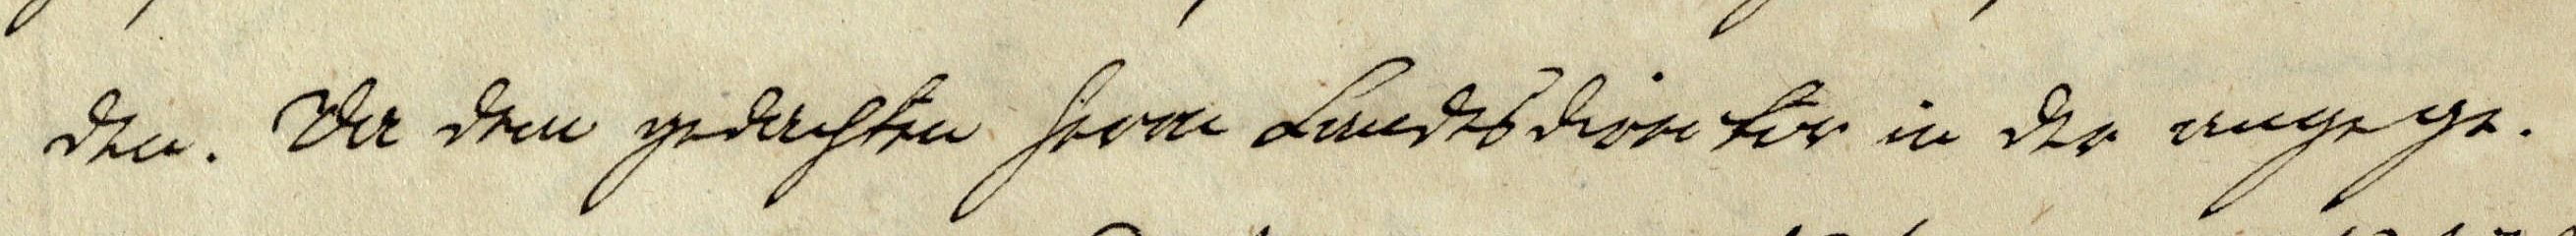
den. Da dem gedachten Herrn Landesdirector in der angege¬
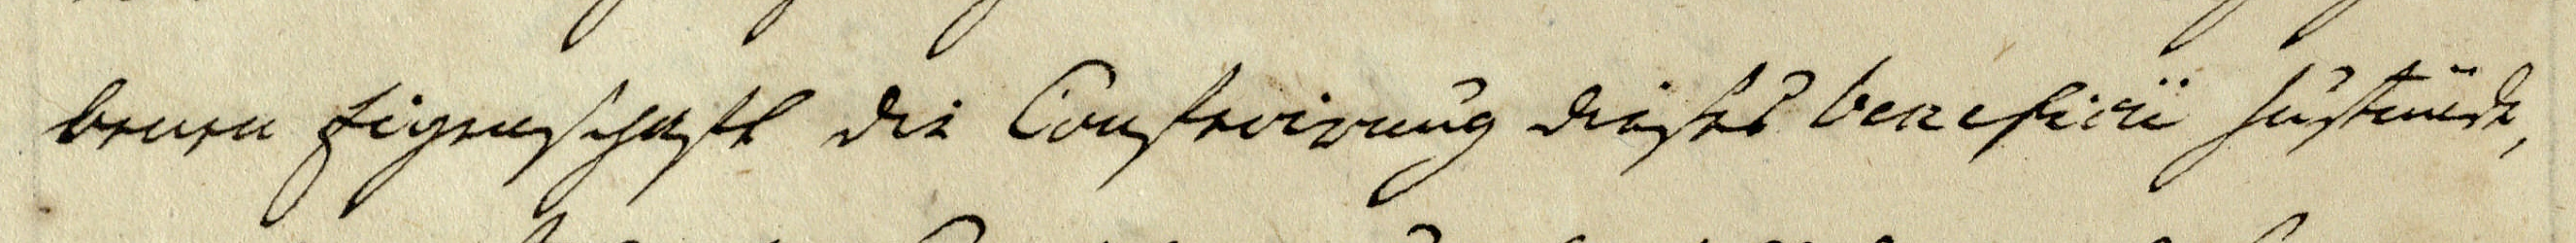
benen Eigenschaft die Conferirung dieses beneficii zustünde,
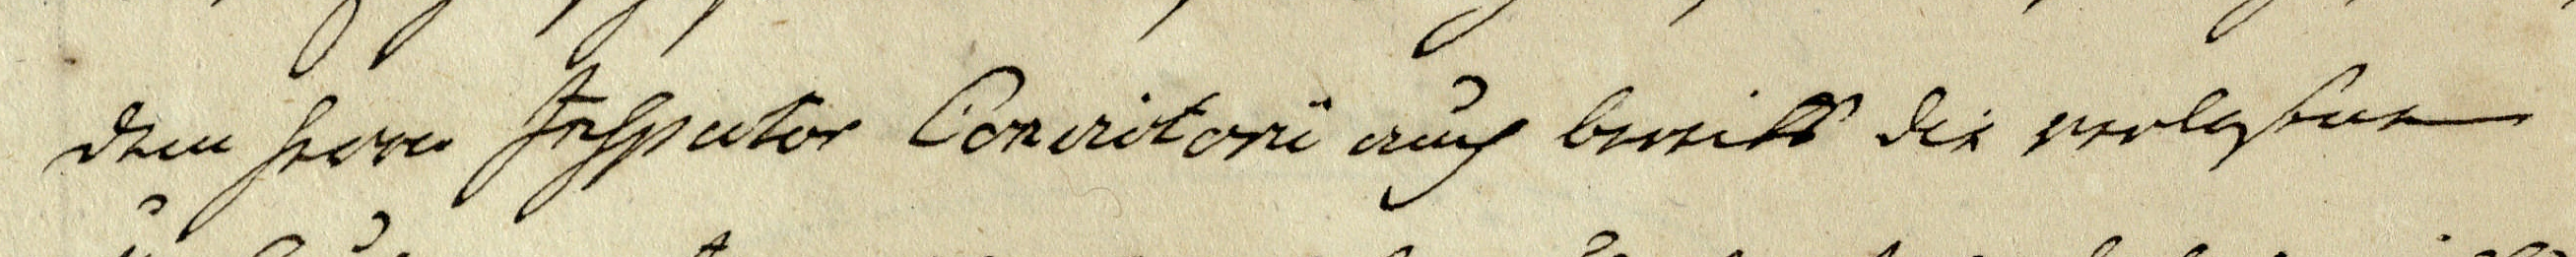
dem Herrn Inspector Convictorii auch bereits die verlesene
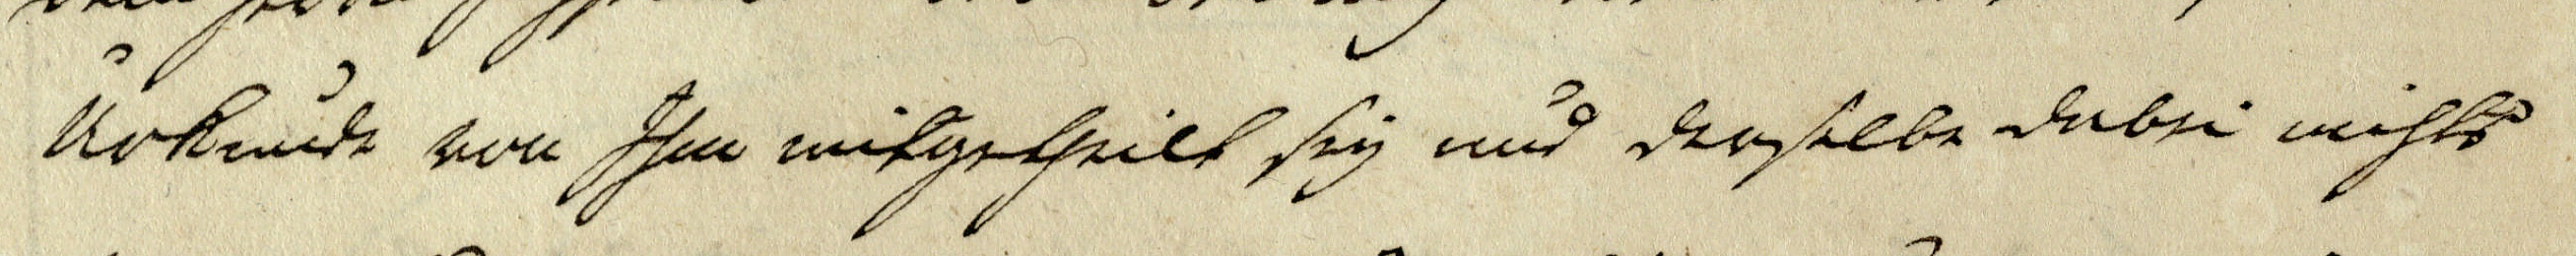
Urkunde von Ihm mitgetheilt seÿ und derselbe dabei nichts
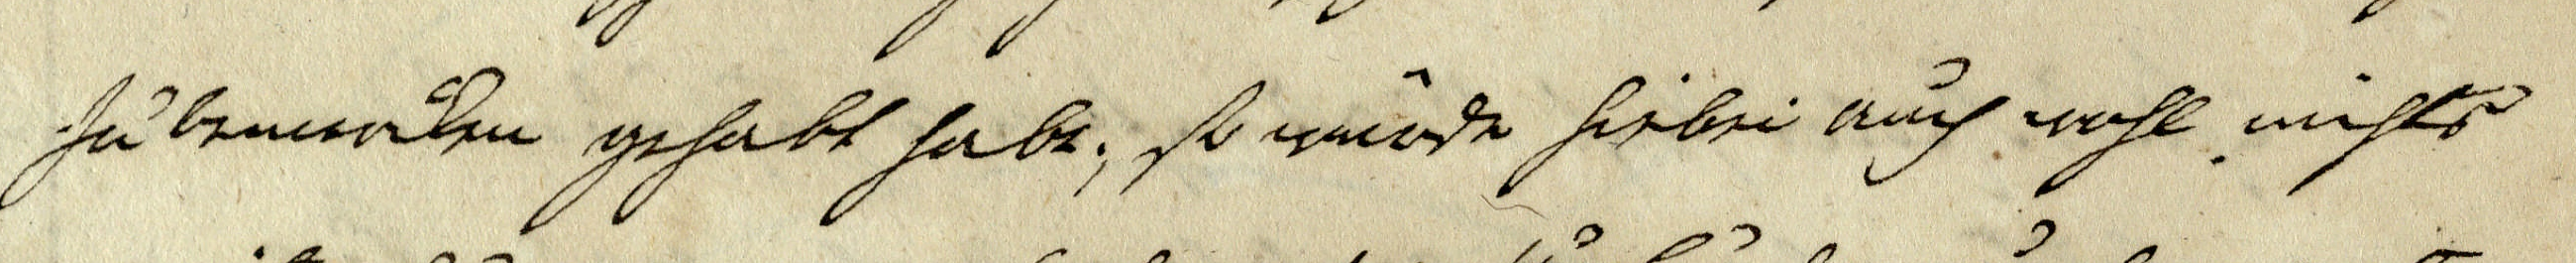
zubemerken gehabt habe, so würde hiebei auch wohl nichts
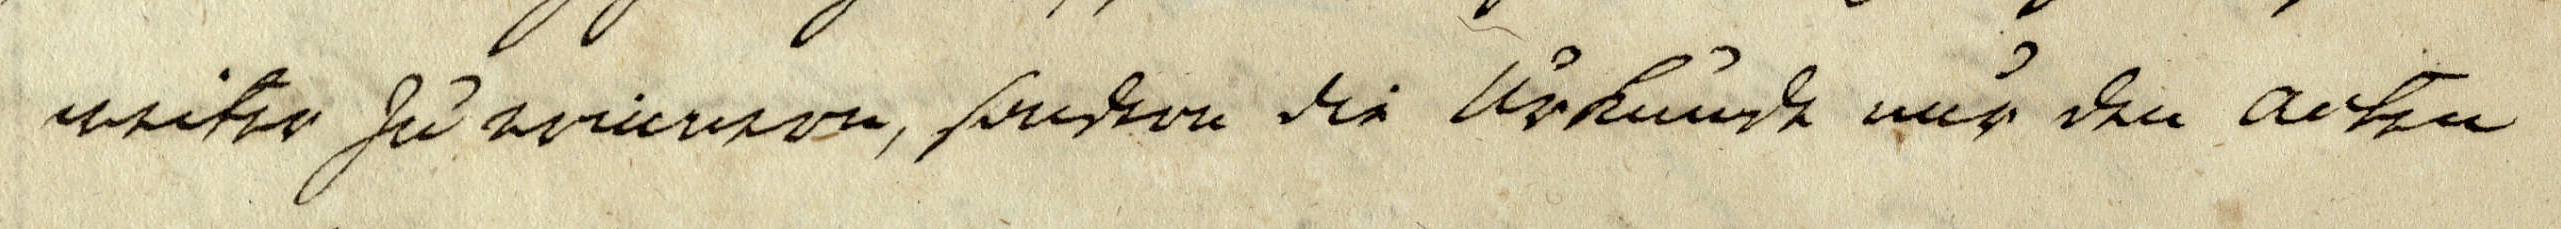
weiter zu erinnern, sondern die Urkunde nur den Acten
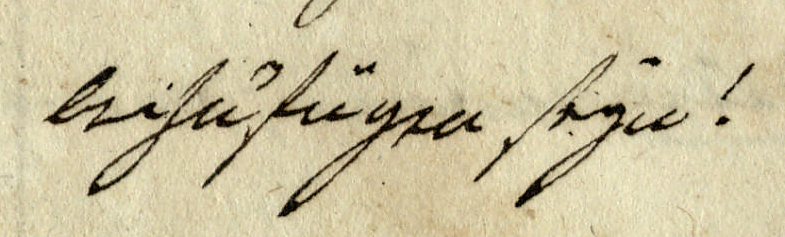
beizufügen seÿn!
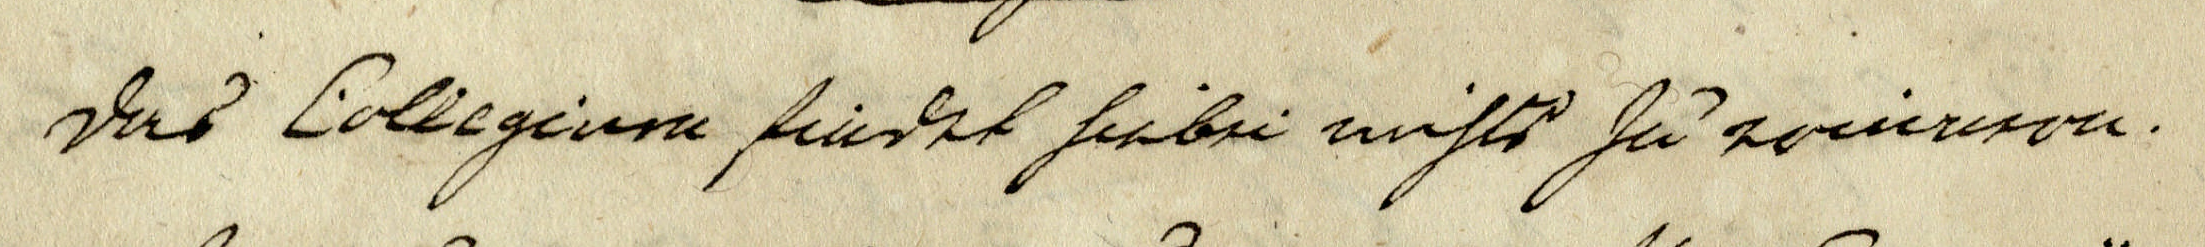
Das Collegium findet hiebei nichts zu erinnern.
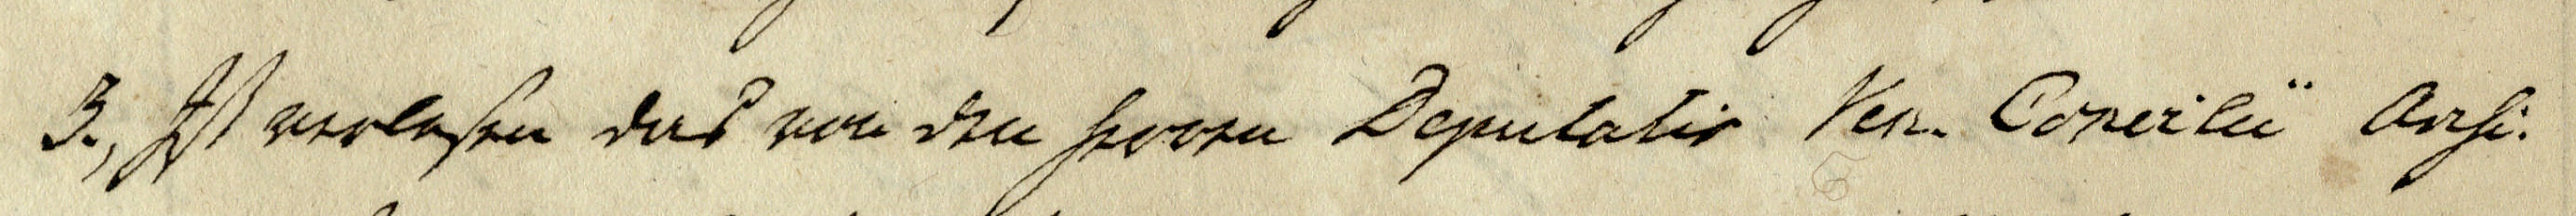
3., Ist verlesen das von den Herren Deputatis Ven. Concilii Archi¬
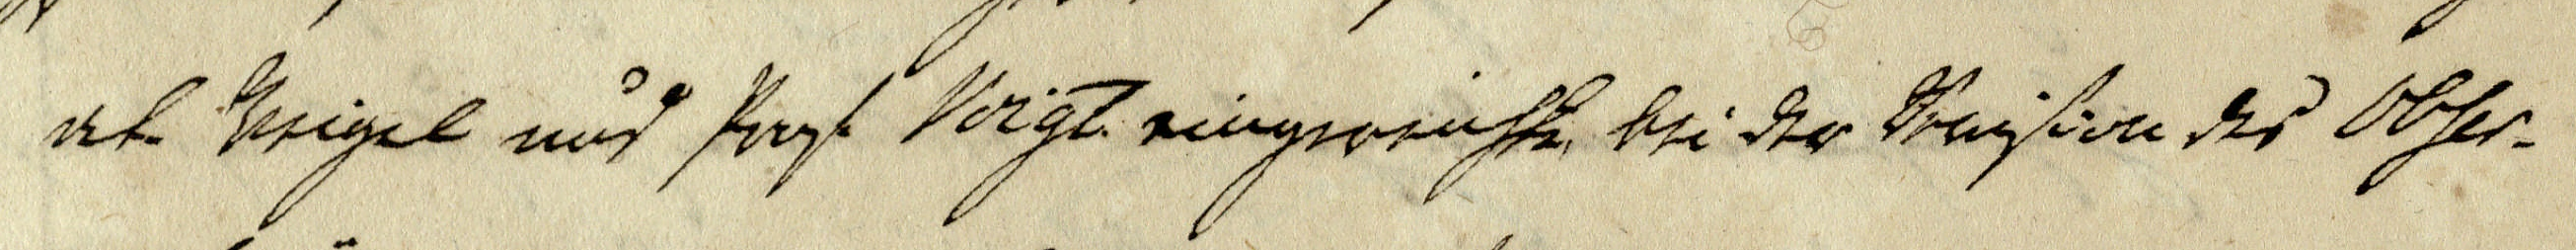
at. Weigel und Prof. Voigt eingereichte, bei der Revision des Obser¬
